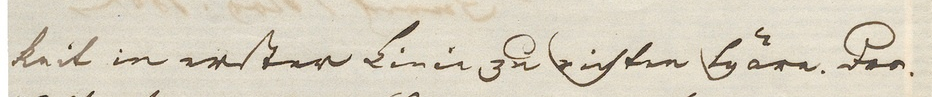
keit in erster Linie zu richten wäre. Des-
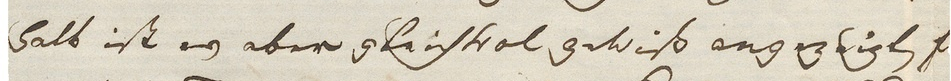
halb ist es aber gleichwol gewiß angezeigt,
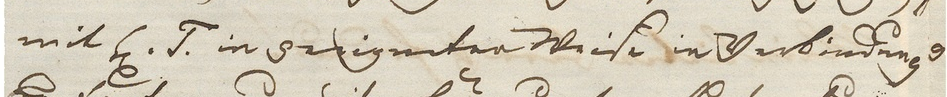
mit H. T. in geeigneter Weise in Verbindung
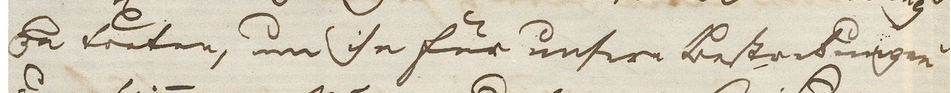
zu treten, um ihn für unsere Bestrebungen
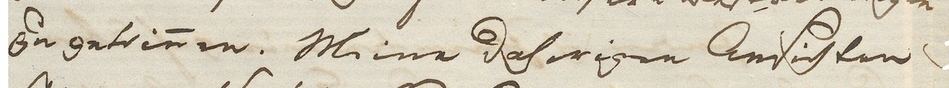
zu gewinnen. Meine daherigen Ansichten
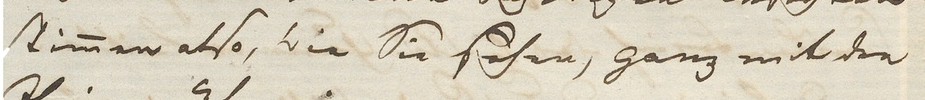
stimmen also, wie Sie sehen, ganz mit den
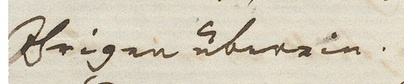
Ihrigen überein.
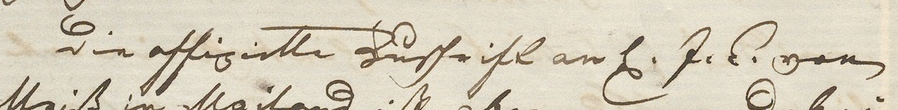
Die offizielle Zuschrift an H. J. C. von
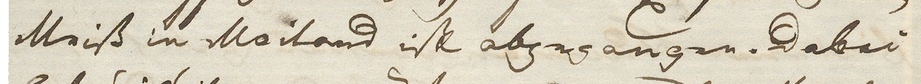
Meiß in Mailand ist abgegangen. Dabei
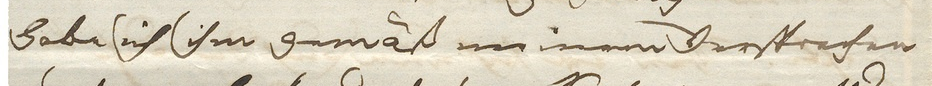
habe ich ihm gemäß meinem Versprechen
